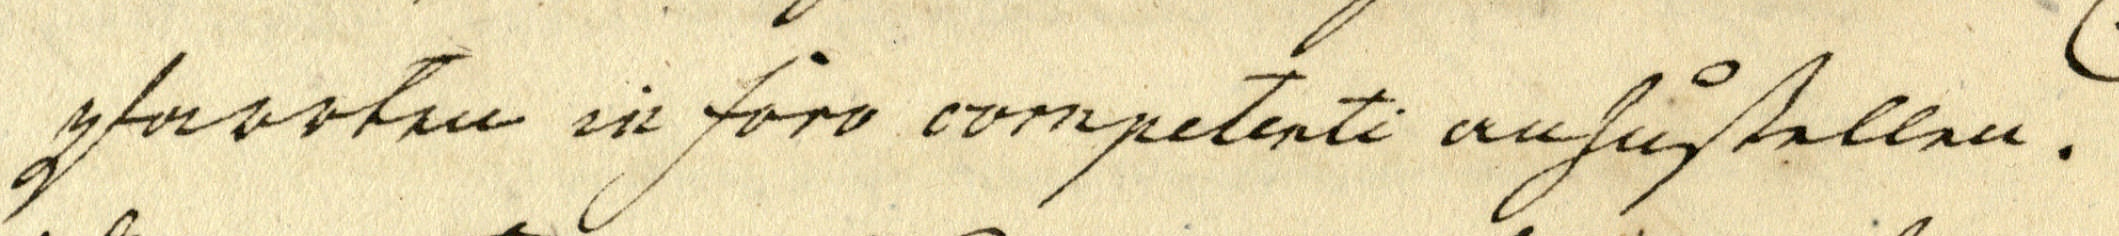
pfarrten in Foro competenti anzustellen.
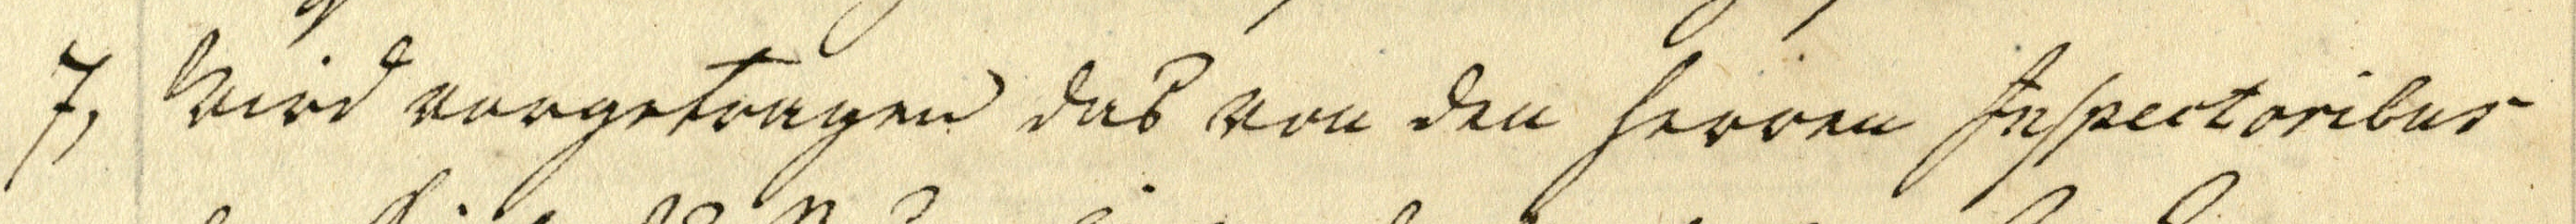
7. Wird vorgetragen das von den herren Inspectoribus
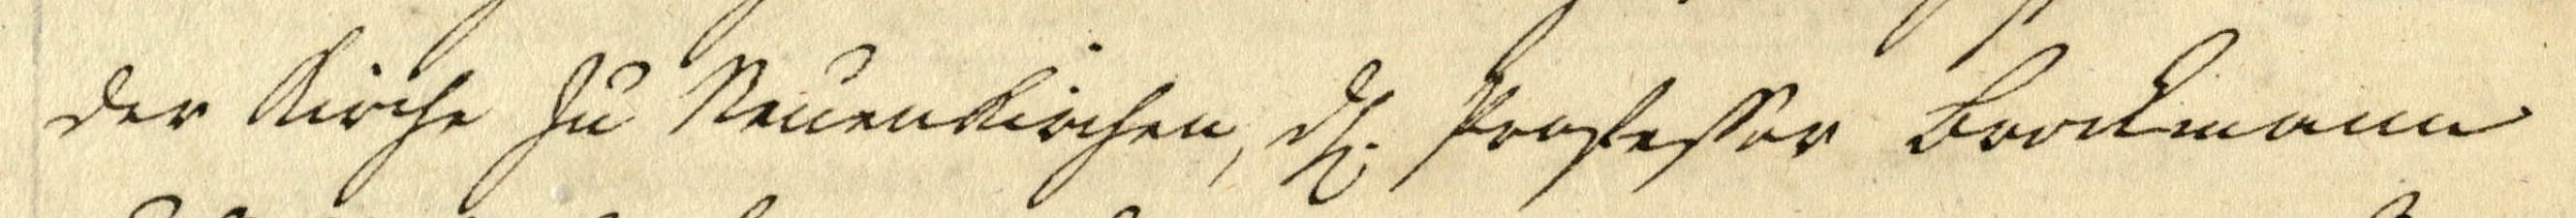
der Kirche zu Neuenkirchen, dh. Professor Brockmann
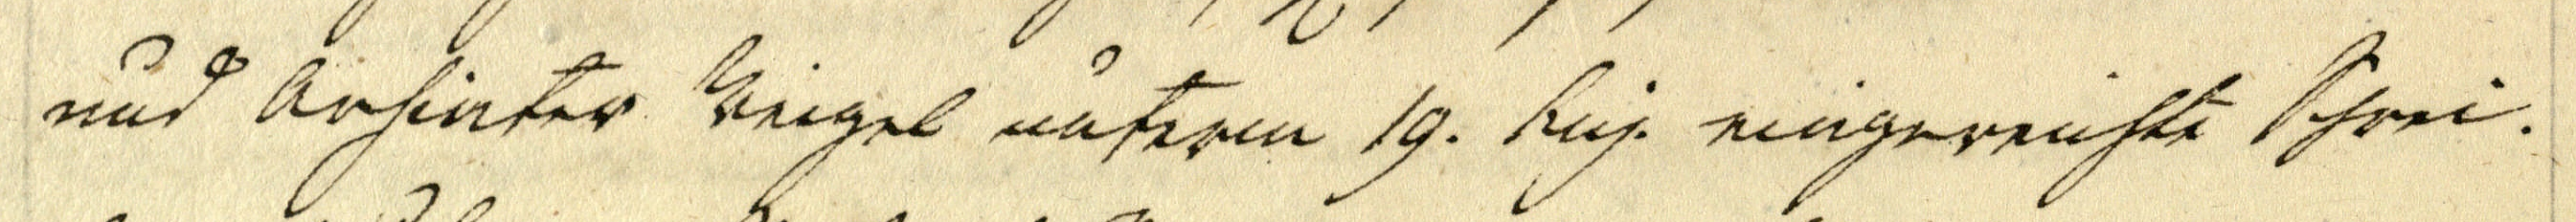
und Archiater Weigel unterm 19. huj. eingereichte Schrei¬
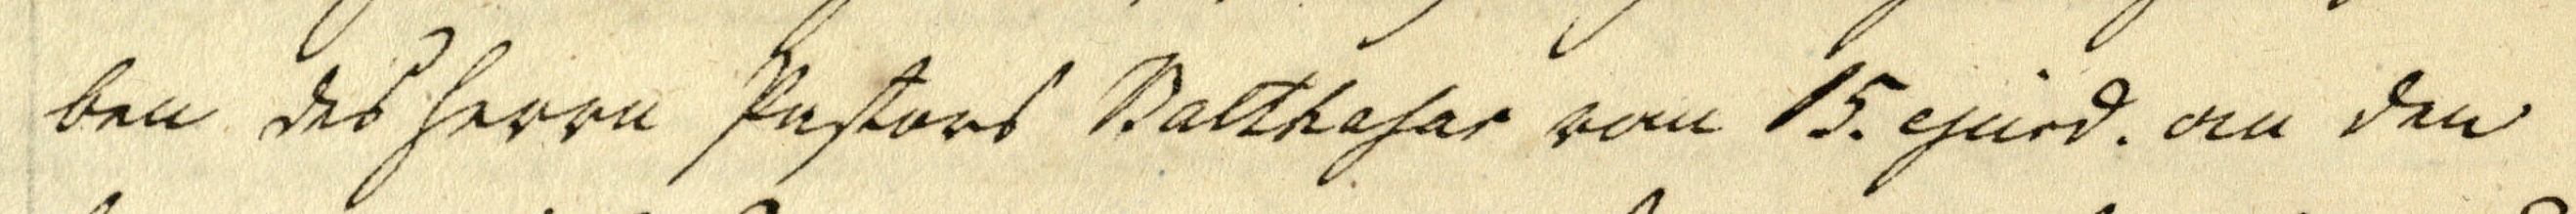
ben des Herrn Pastor Balthasar vom 15. ejusd. an den
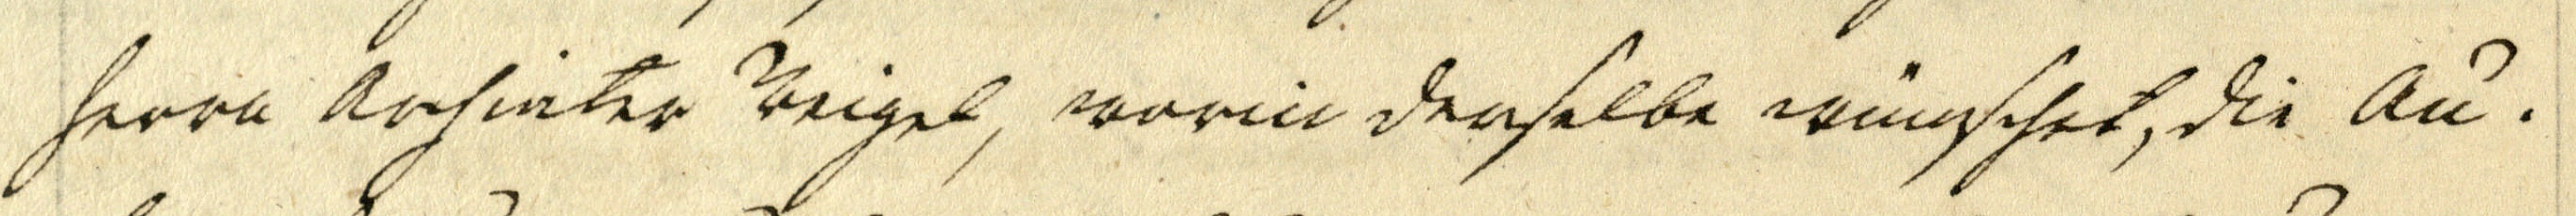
herrn Archiater Weigel, worin derselbe wünschet, die Au¬
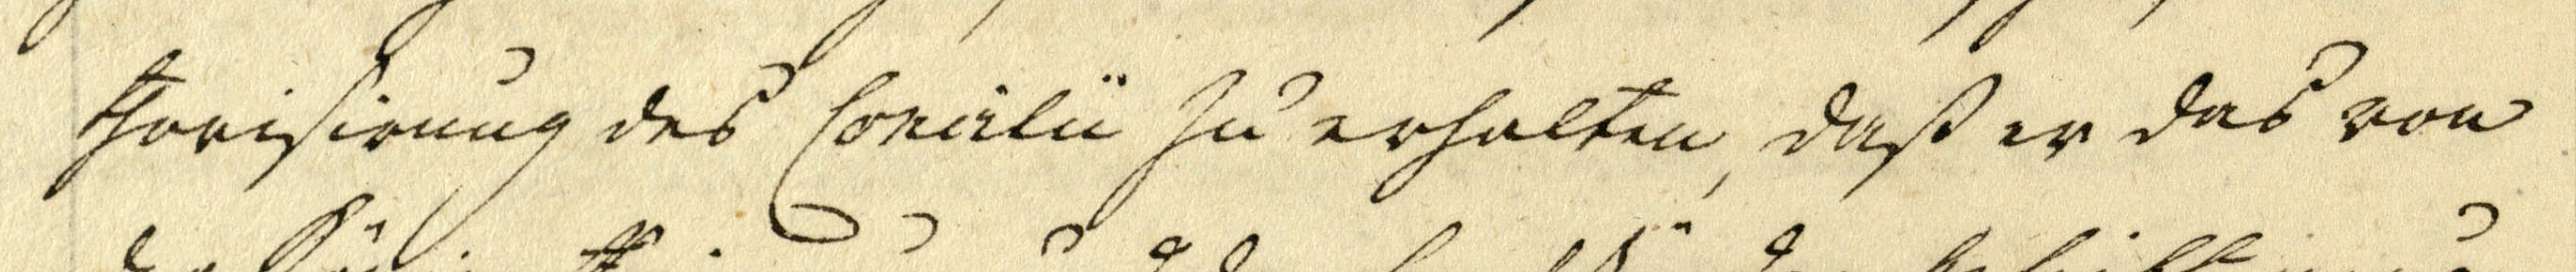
thorisirung des Concilii zu erhalten, daß er das von
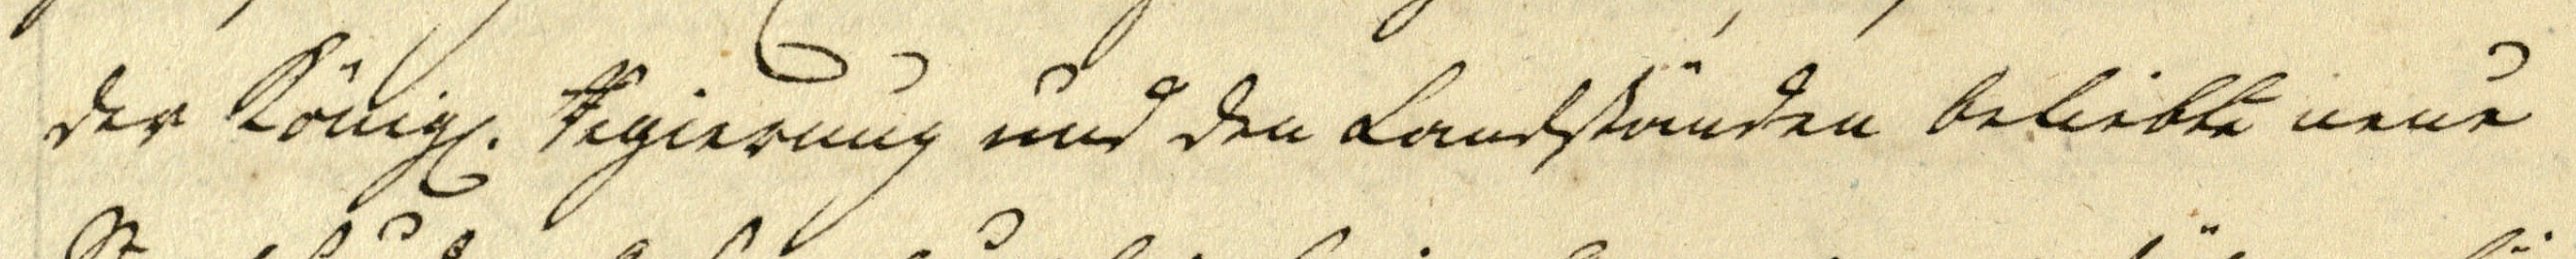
der Königl. Regierung und den Landständen beliebte neue
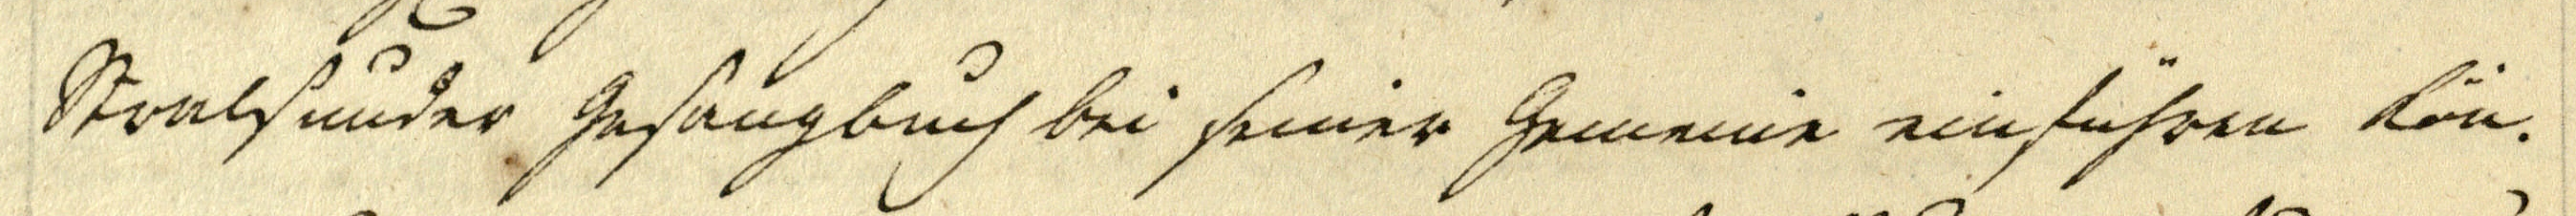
Stralsunder Gesangbuch bei seiner Gemeine einführen kön¬
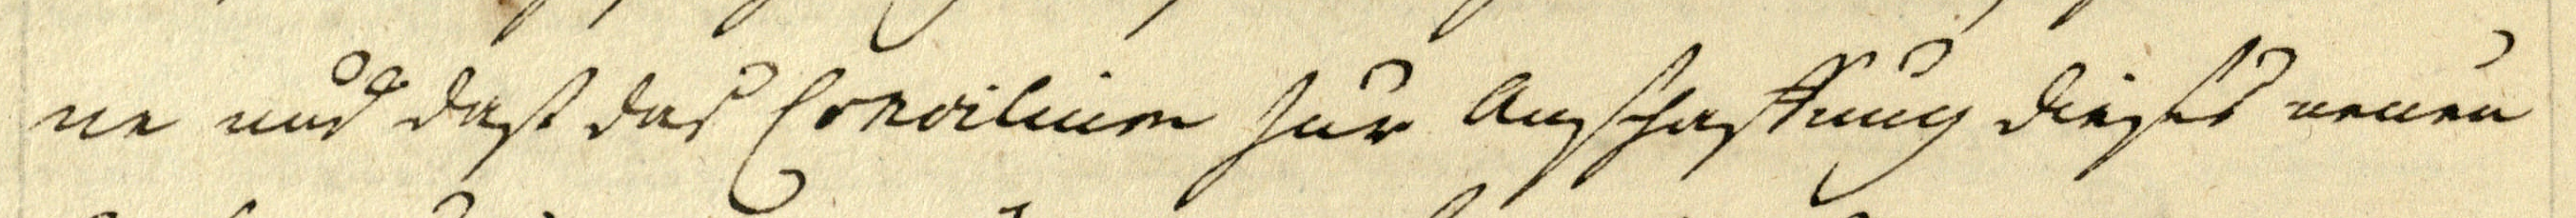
ne und daß das Concilium zur Anschaffung dieses neuen
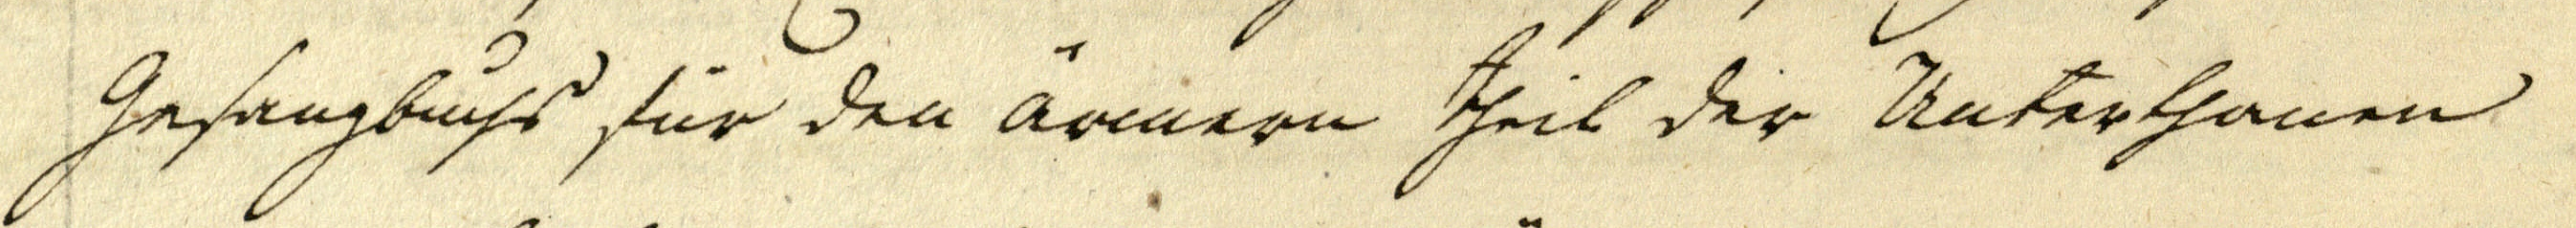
Gesangbuchs für den ärmern Theil der Unterthanen
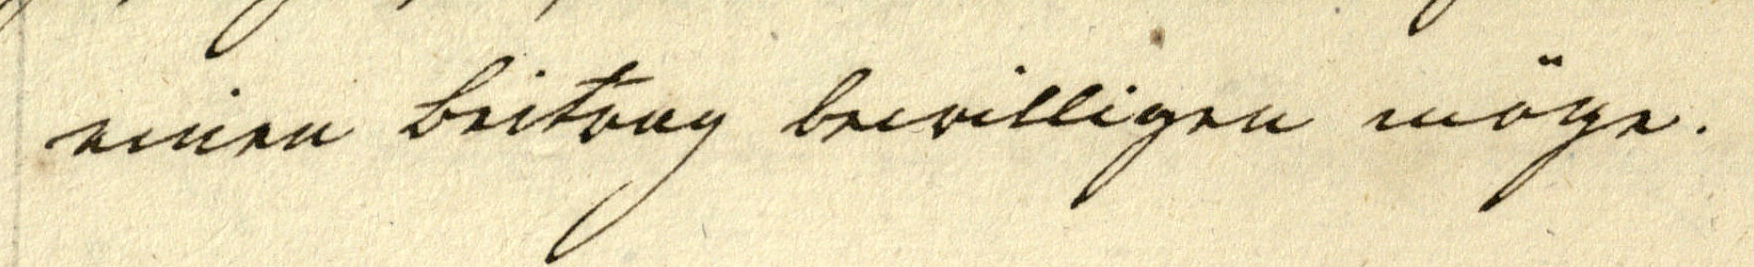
einen Beitrag bewilligen möge.
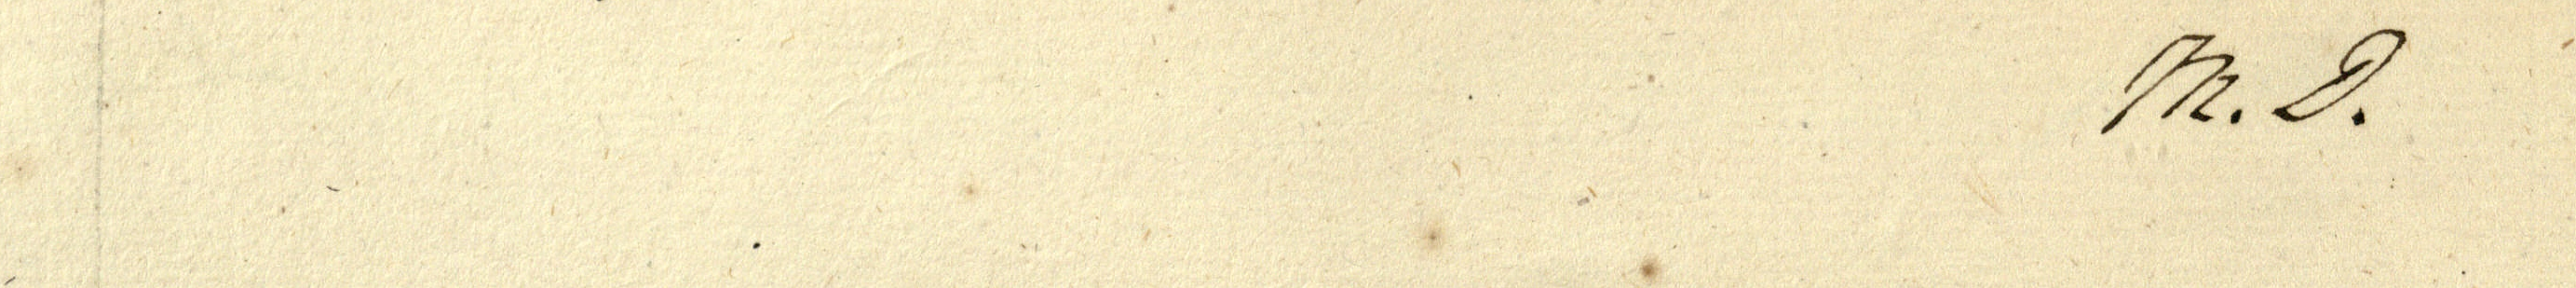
M.D.
